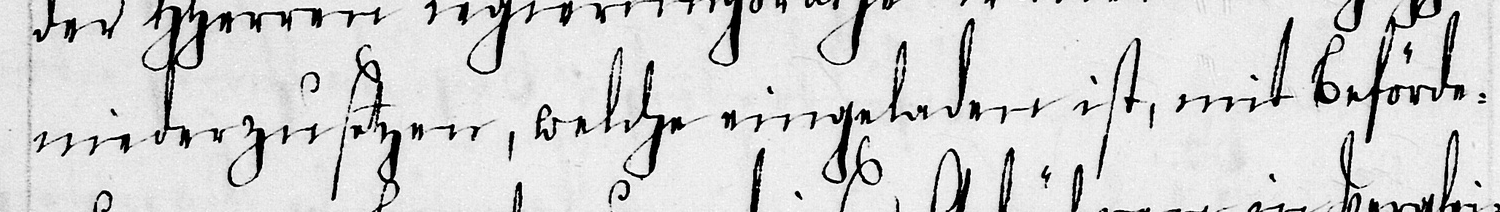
niederzusetzen, welche eingeladen ist, mit Beförde¬
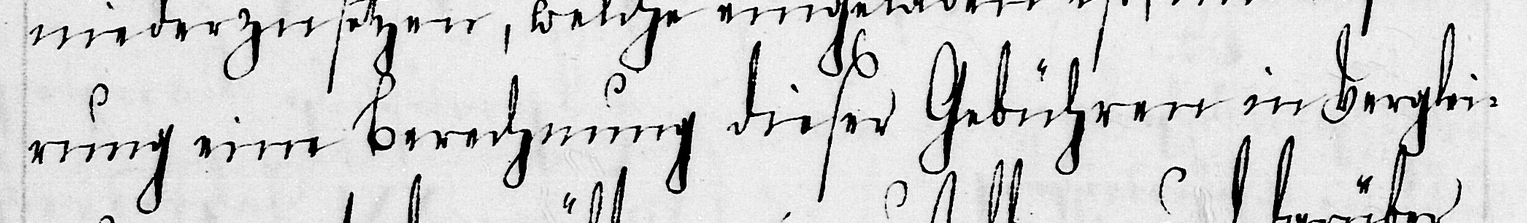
rung eine Berechnung dieser Gebühren in Verglei¬
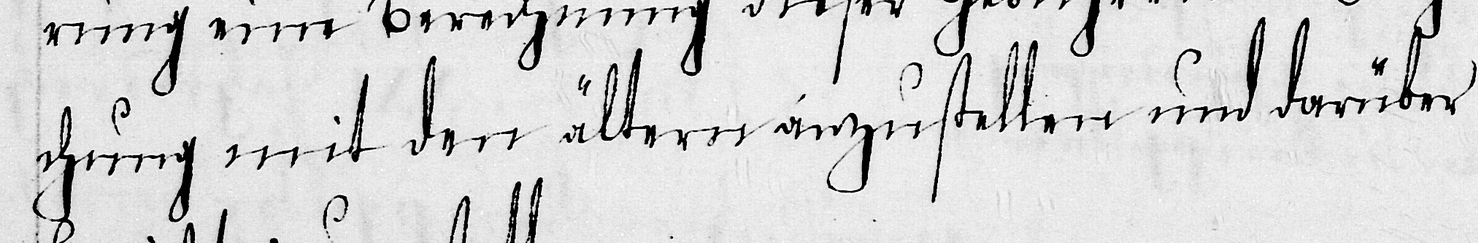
chung mit den ältern anzustellen und darüber
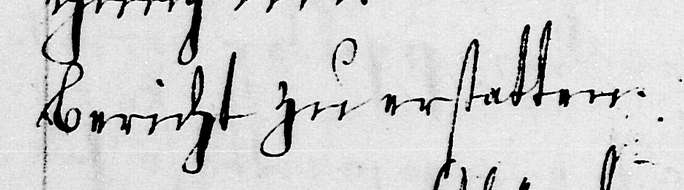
Bericht zu erstatten.
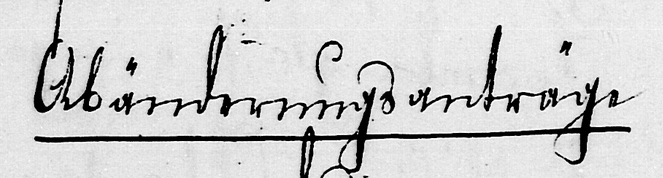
Abänderungsanträge
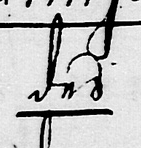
des
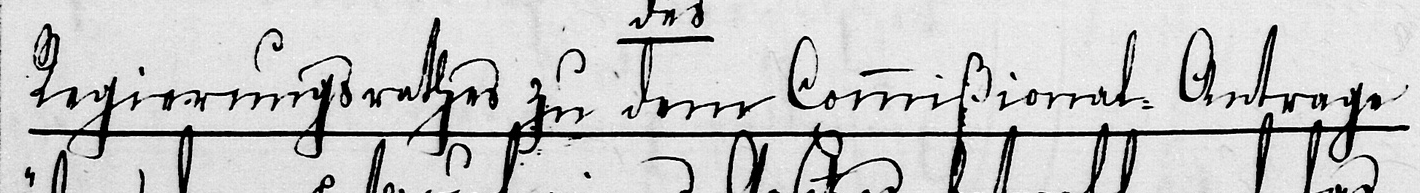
Regierungsrathes zu dem Commißional-Antrage
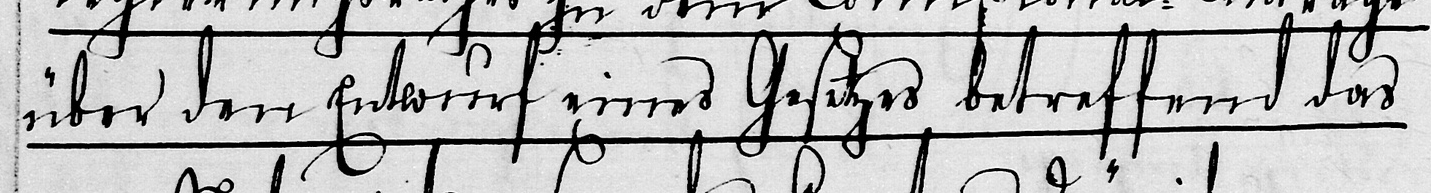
über den Entwurf eines Gesetzes betreffend das
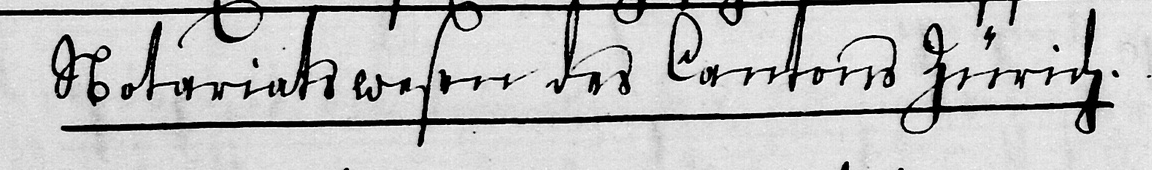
Notariatswesen des Cantons Zürich.
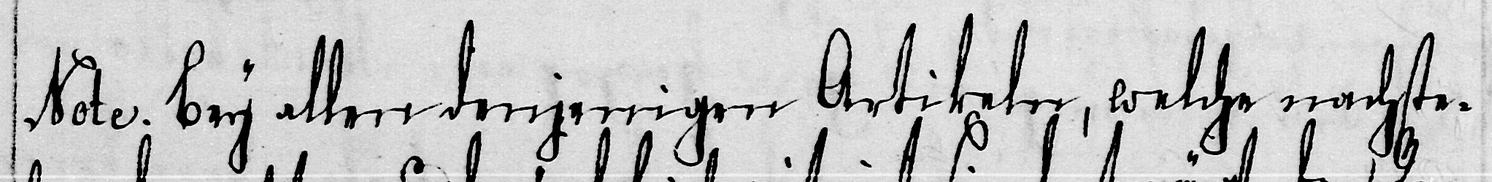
Note. Bey allen denjenigen Artikeln, welche nachste¬
